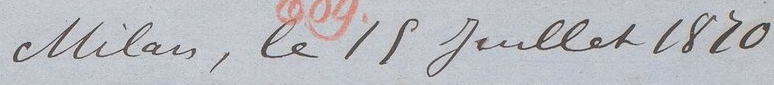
Milan, le 15 Juillet 1870
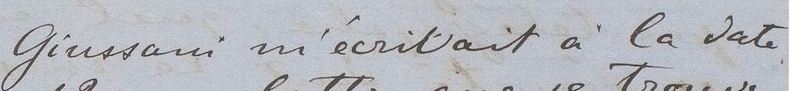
Giussani m'écrivait à la date
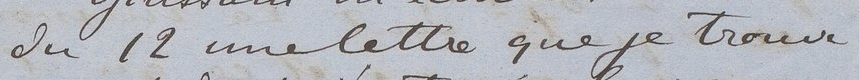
du 12 une lettre que je trouve
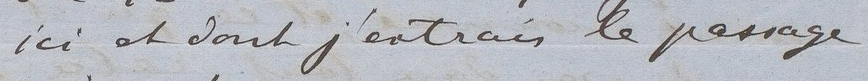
ici et dont j'extrais le passage
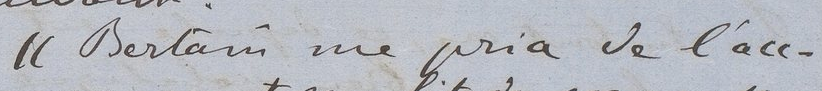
«Bertani me pria de l'acc-
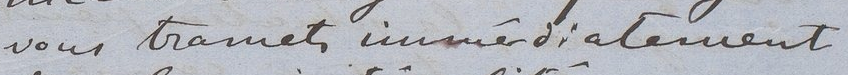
vous transmet immédiatement
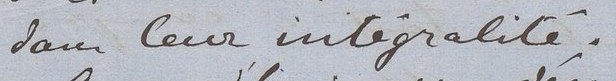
dans leur intégralité.
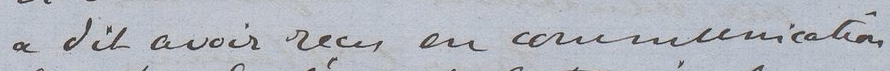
a dit avoir reçu en communication
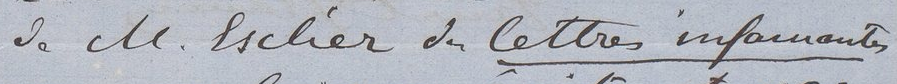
de M. Escher des lettres informantes
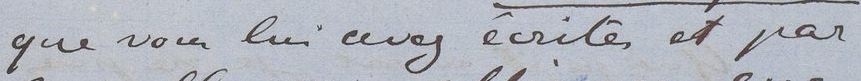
que vous lui avez écrites et par
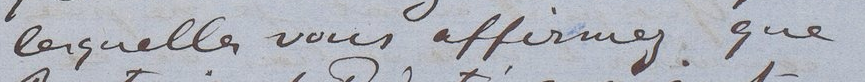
lesquelles vous affirmez que
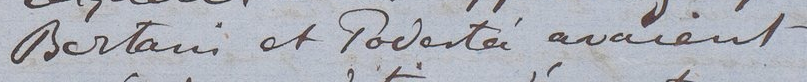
Bertani et Podestà avaient
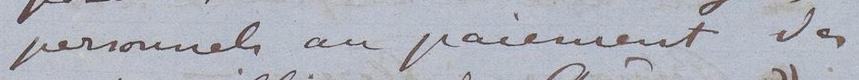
personnels au paiement des
